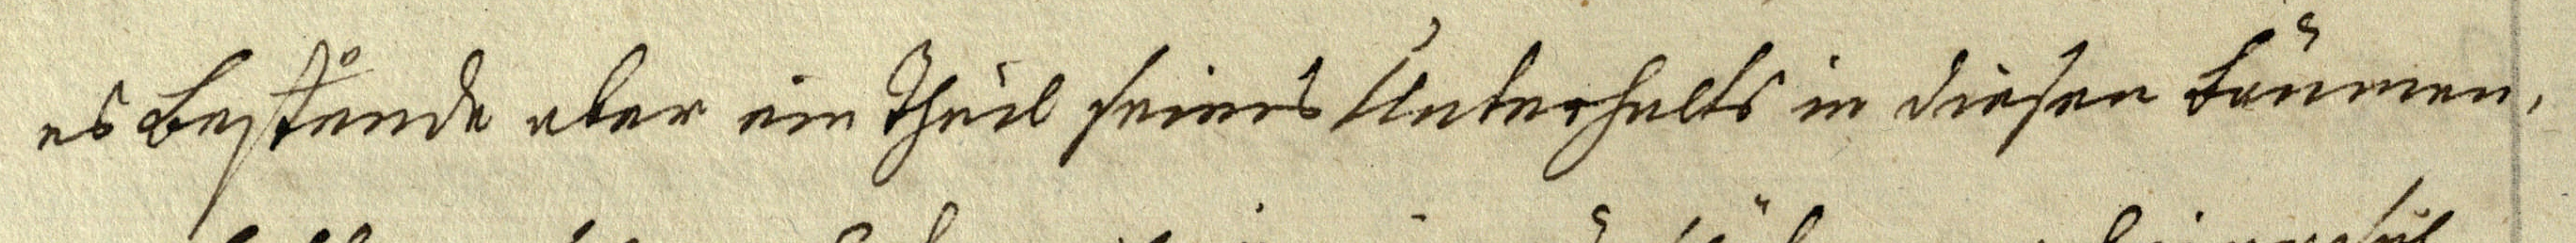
er bestünde aber ein Theil seines Unterhalts in diesen Bäumen,
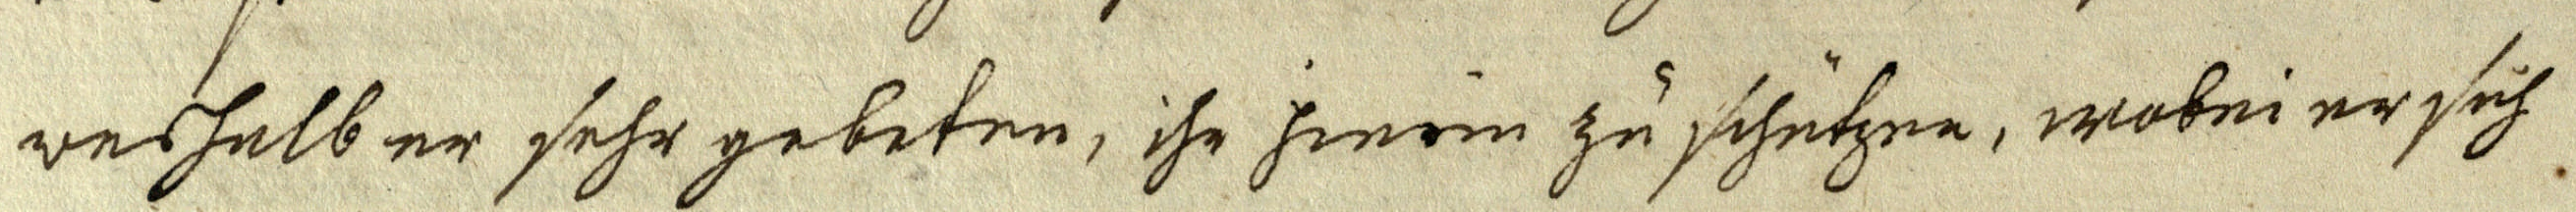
weshalb er sehr gebeten, ihn hierin zu schützen, wobei er sich
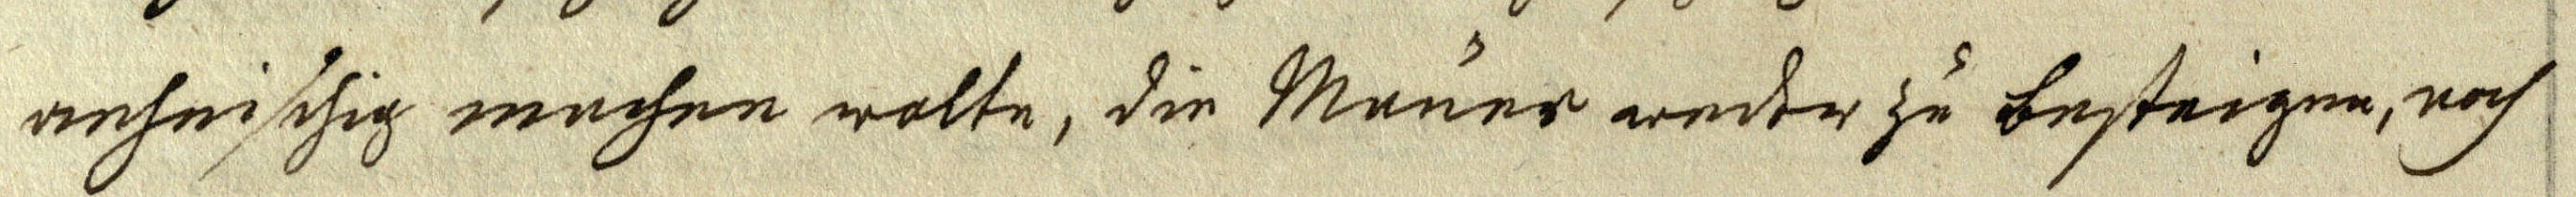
anheischig machen wolte, die Mauer weder zu besteigen, noch
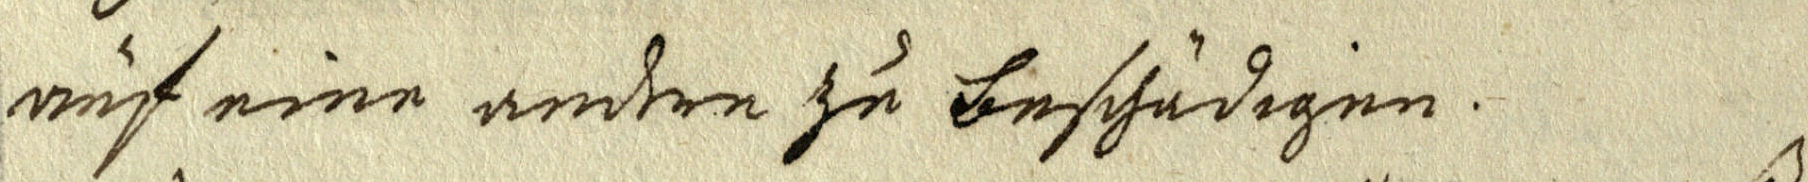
auf eine andere zu beschädigen.
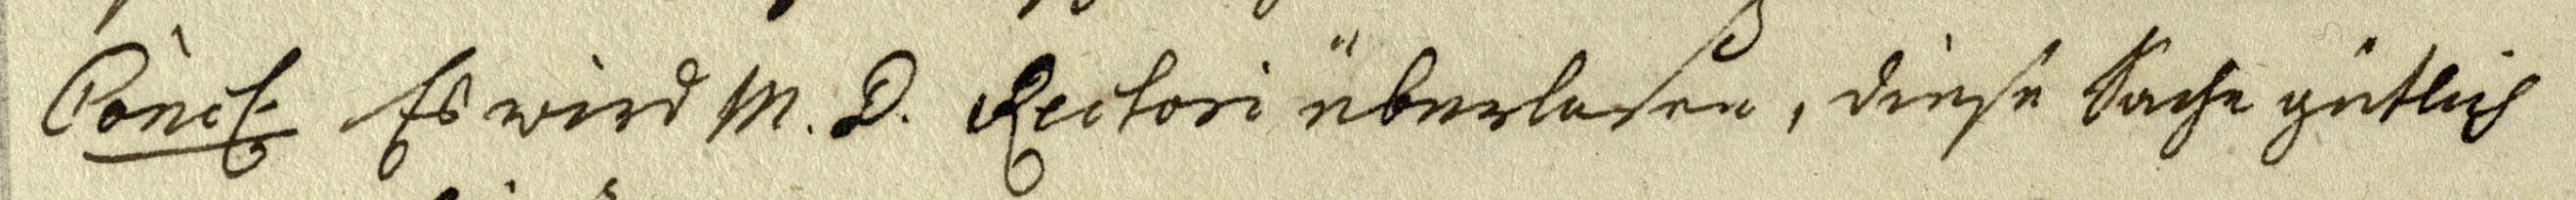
Concl. Es wird M. D. Rectori überlaßen, diese Sache gütlich
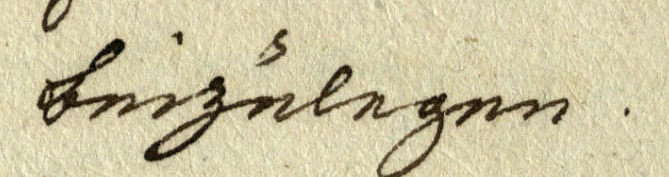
beizulegen.
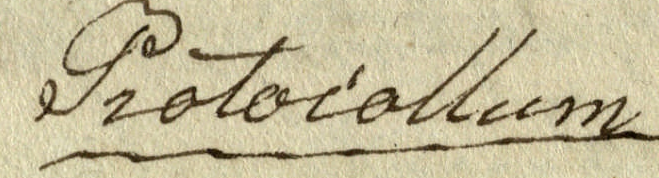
Protocollum
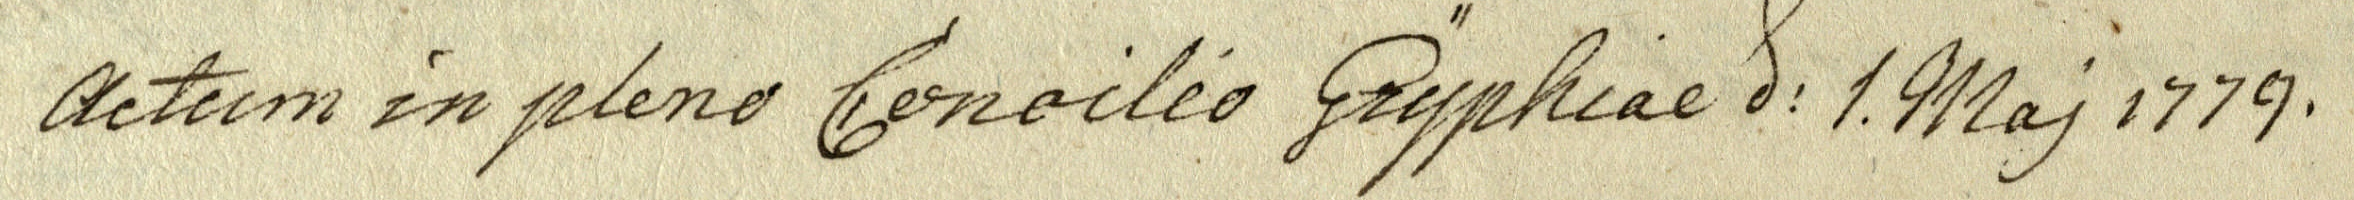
Actum in pleno Concilio Grÿphiae d. 1. Maj 1779.
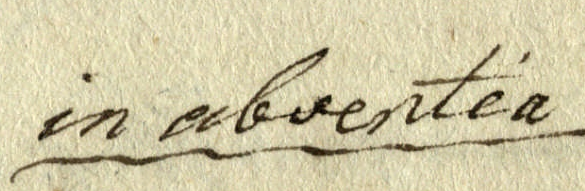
in absentia
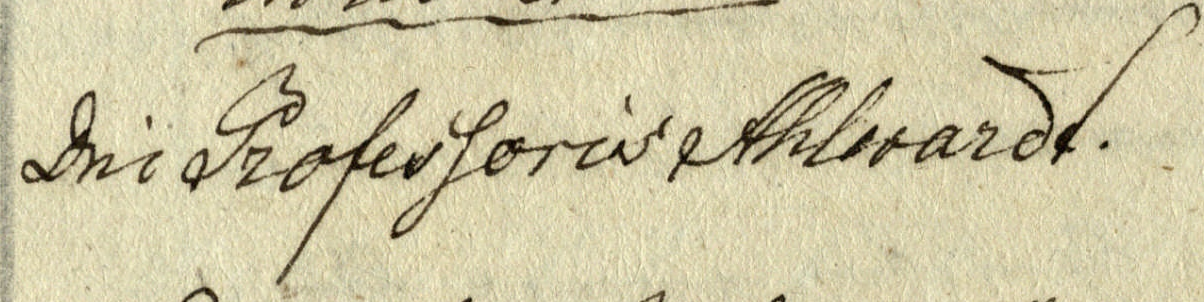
Dni Professoris Ahlwardt.
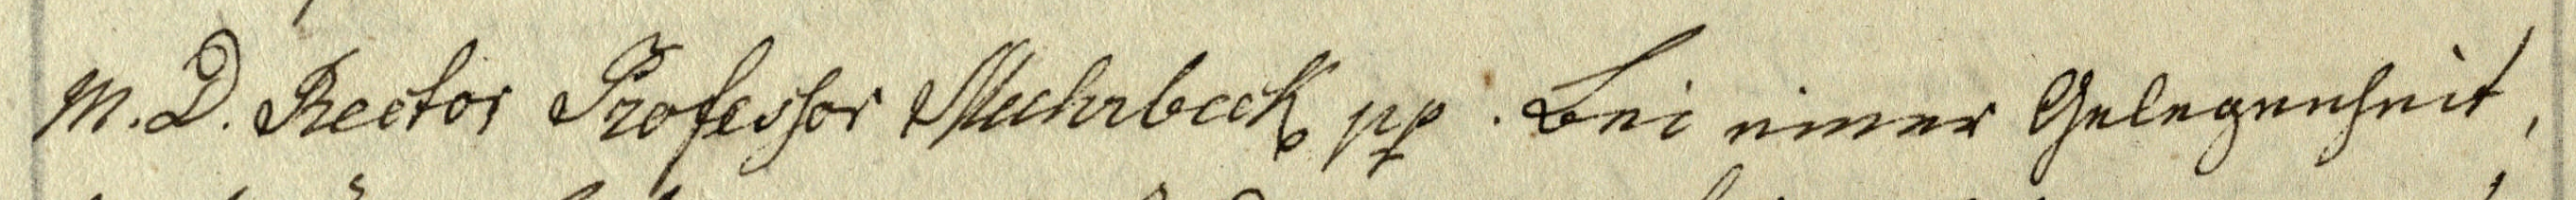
M. D. Rector Professor Muhrbeck pp. Bei einer Gelegenheit,
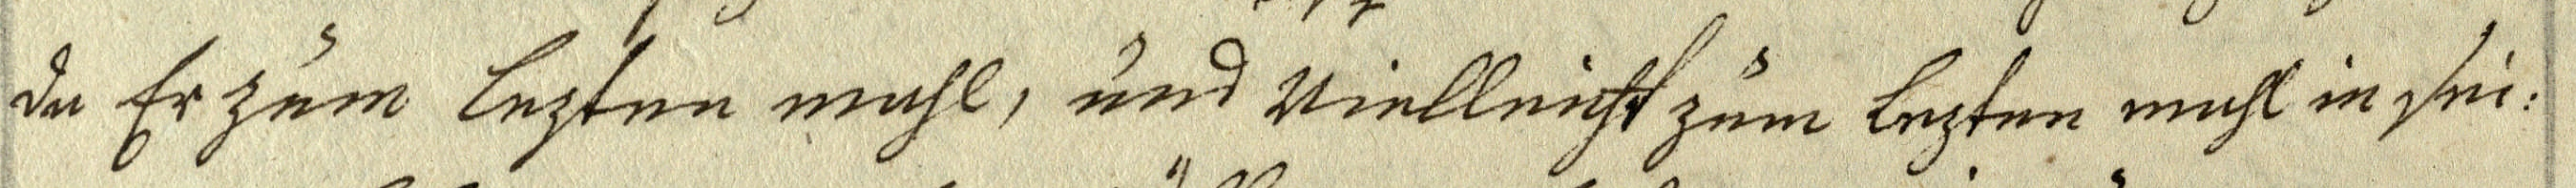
da Er zum lezten mahl, und vielleicht zum lezten mahl in sei¬
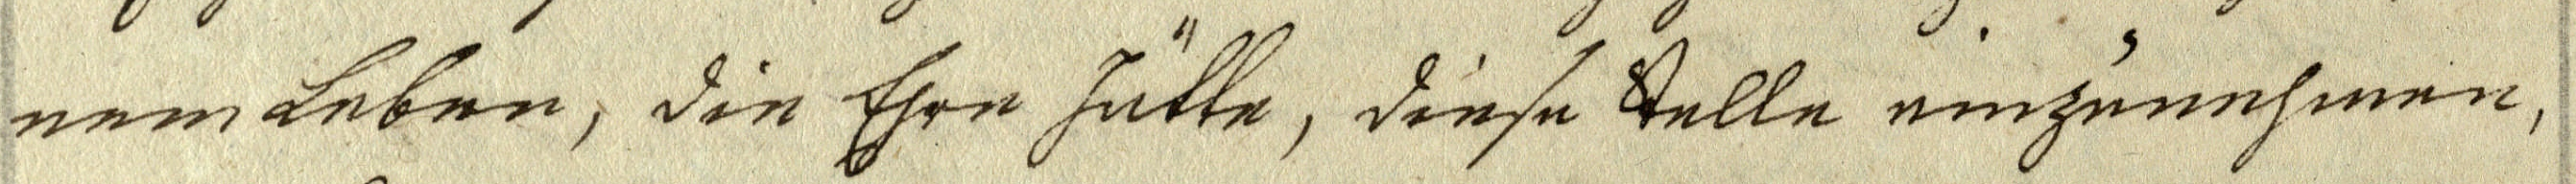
nem Leben, die Ehre hätte, diese Stelle einzunehmen,
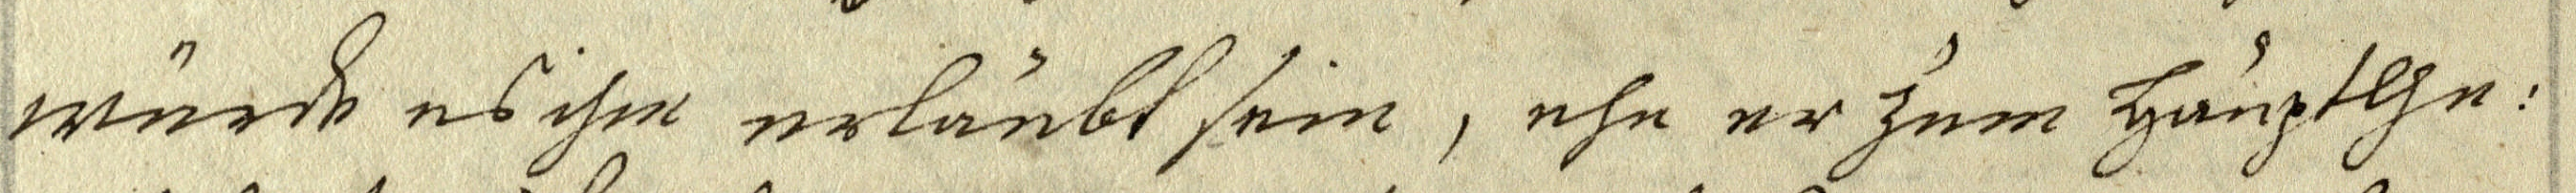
würde es ihm erlaubt sein, ehe Er zum Hauptge¬
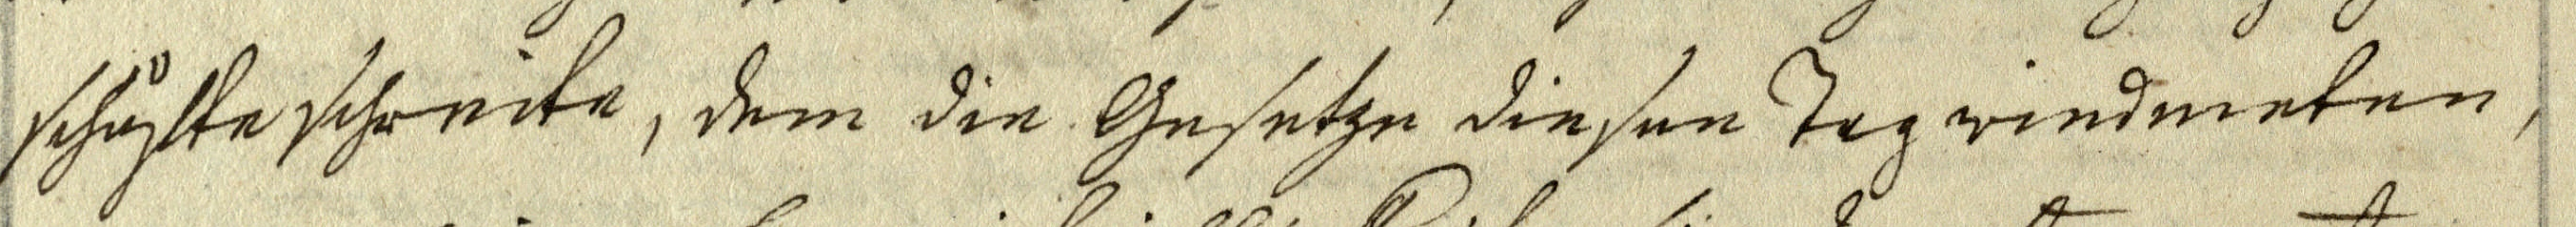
schäfte schreite, dem die Gesetze diesen Tag widmeten,
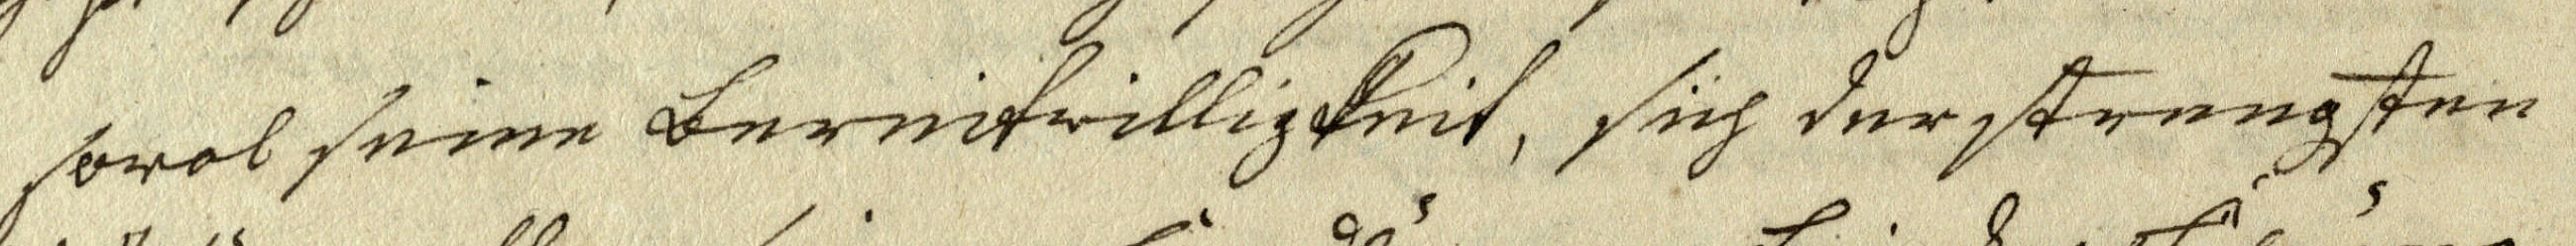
wol seine Bereitwilligkeit, sich der strengsten
